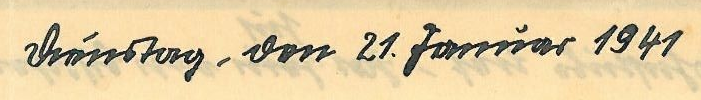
Dienstag, den 21. Januar 1941
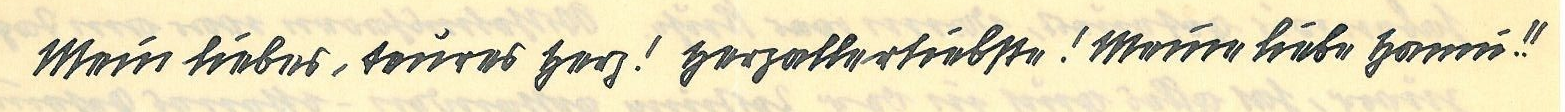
Mein liebes, teures Herz! Herzallerliebste! Meine liebe !!
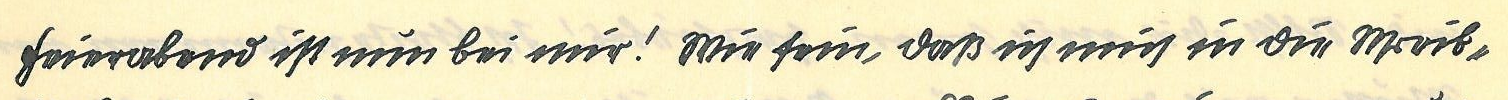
Feierabend ist nun bei mir! Wie fein, daß ich mich in die Schreib¬
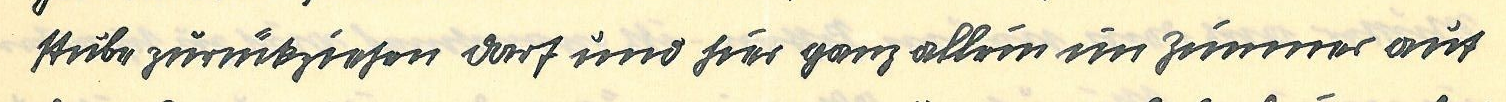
stube zurückziehen darf und hier ganz allein im Zimmer auf
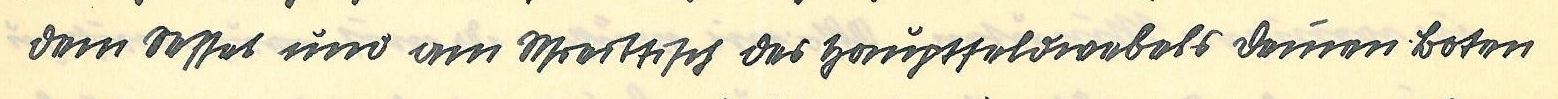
dem Sessel und am Schreibtisch des Hauptfeldwebels Deinen Boten
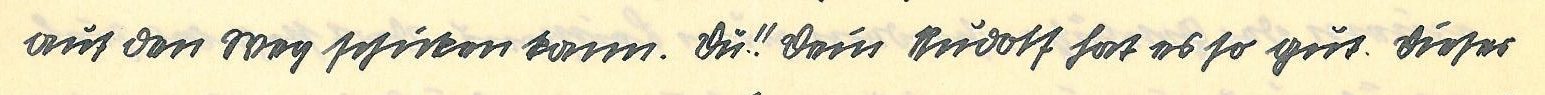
auf den Weg schicken kann. Du!! Dein hat es so gut. Dieser
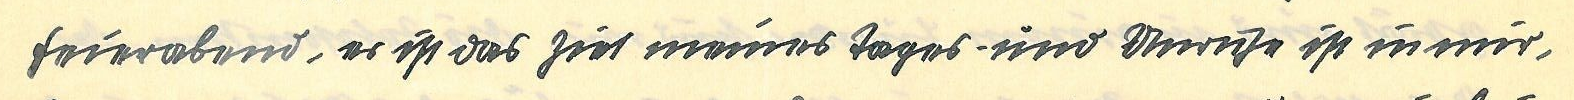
Feierabend, er ist das Ziel meines Tages – und Unruhe ist in mir,
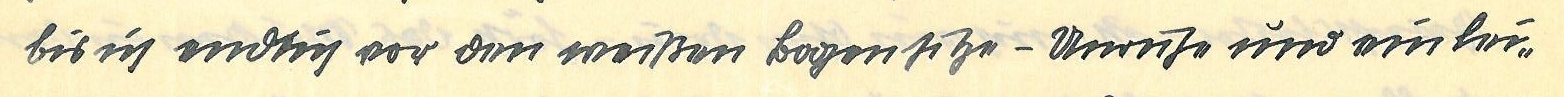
bis ich endlich vor dem weißen Bogen sitze – Unruhe und ein lei¬
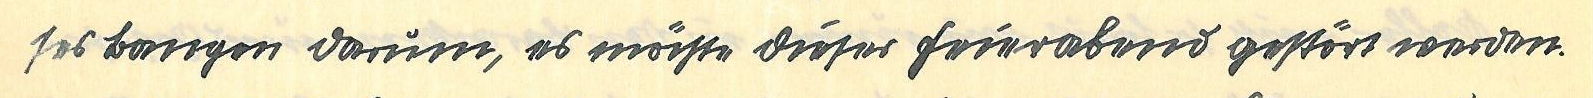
ses Bangen darum, es möchte dieser Feierabend gestört werden.
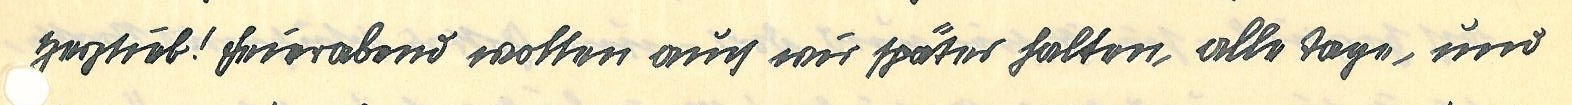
Herzlieb! Feierabend wollen auch wir später halten,alle Tage, und
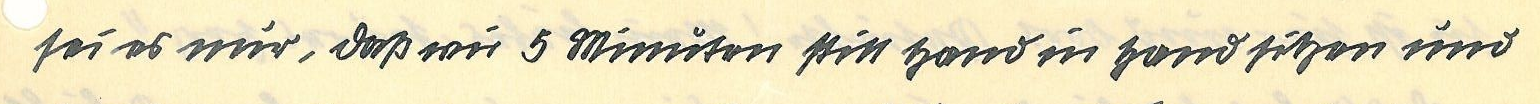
sei es nur, daß wir 5 Minuten still Hand in Hand sitzen und
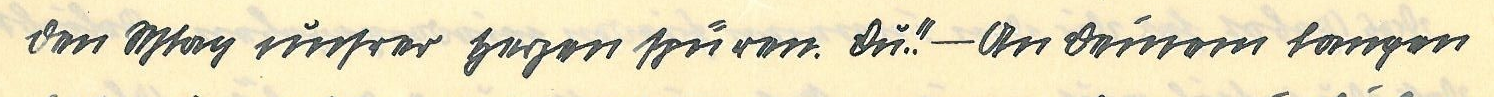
den Schlag unsrer Herzen spüren. Du!! – An Deinem langen
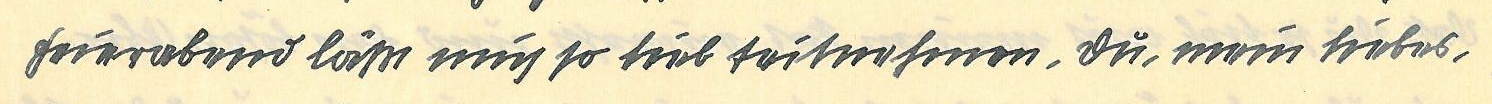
Feierabend läßt mich so lieb teilnehmen, Du, mein liebes,
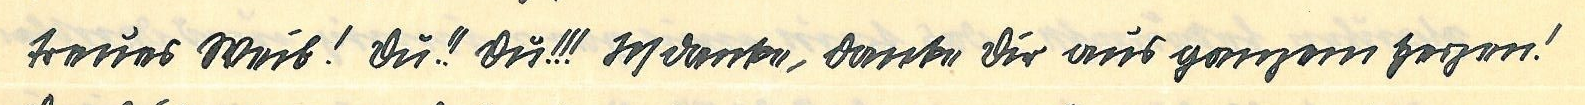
treues Weib! Du!! Du!!! Ich danke, danke Dir aus ganzem Herzen!
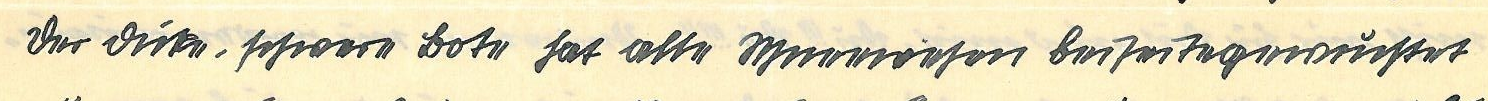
Der dicke, schwere Bote hat alle Schneewehen beiseitegewuchtet
